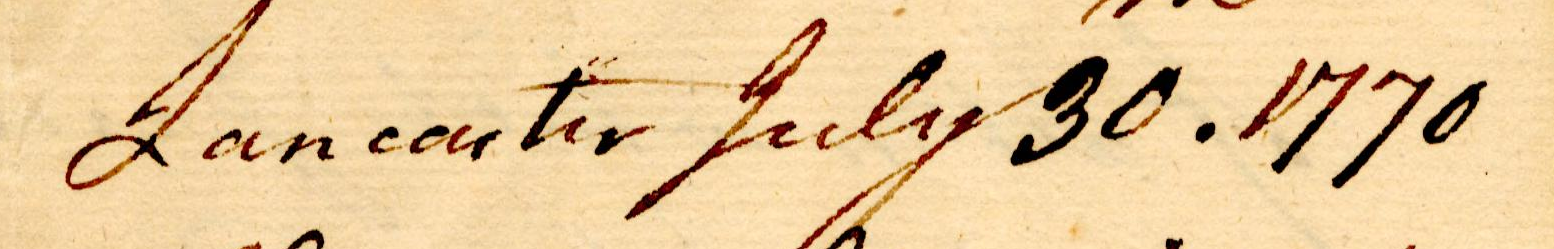Lancaster July 30^th. 1770
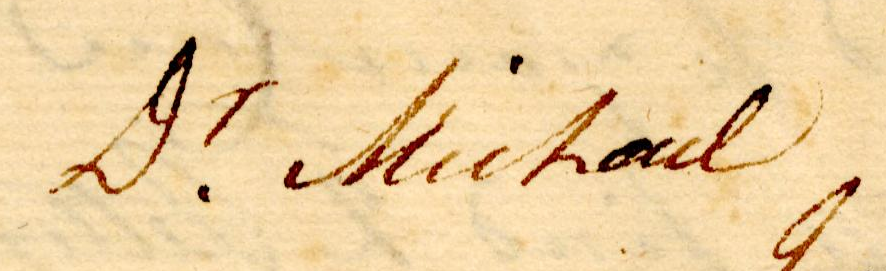D^r Michael
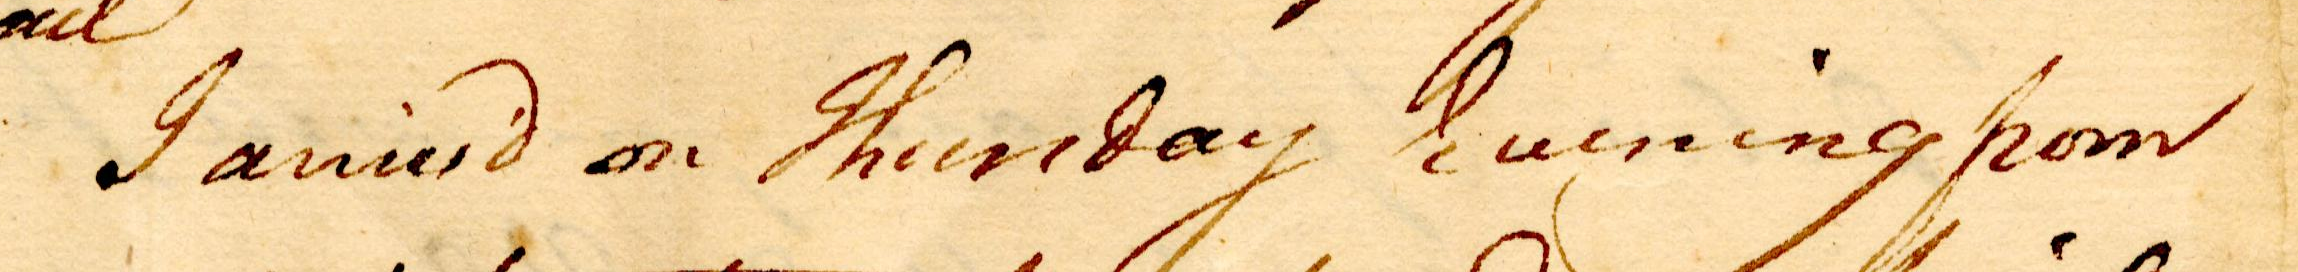I arriv'd on Thursday Evening from
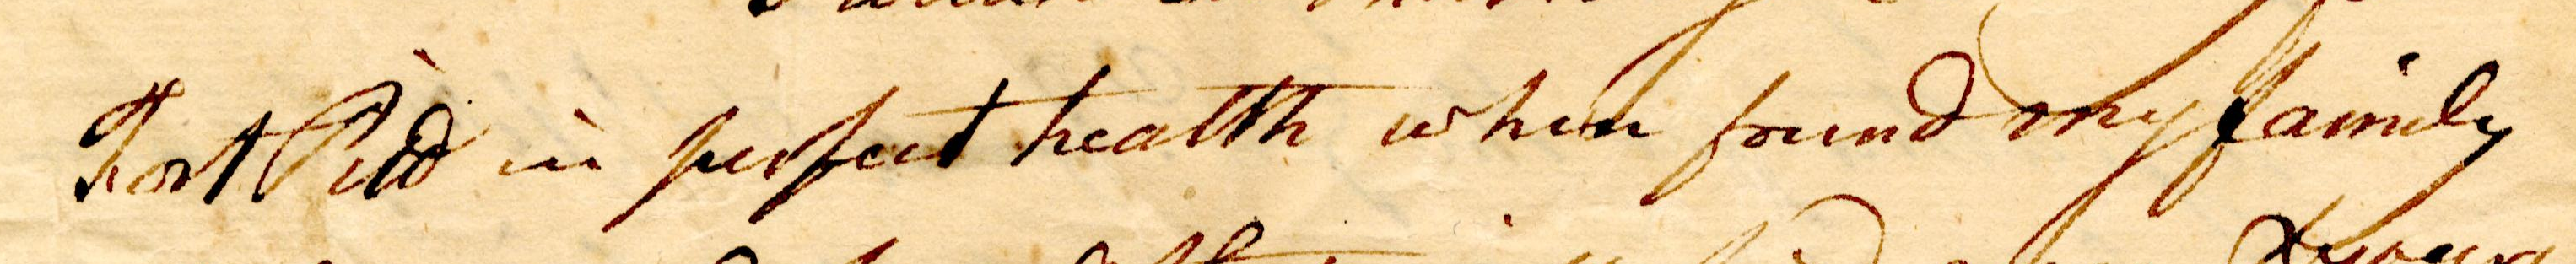Fort Pitt in perfect health when found my family
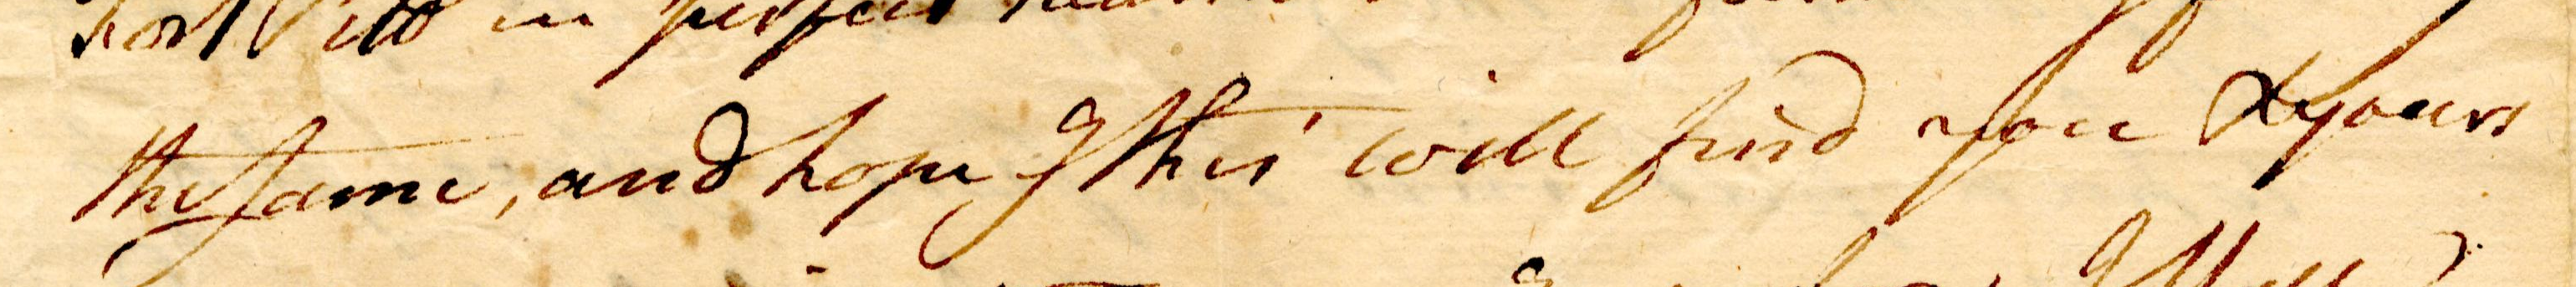the same, and hope^g this will find you & yours
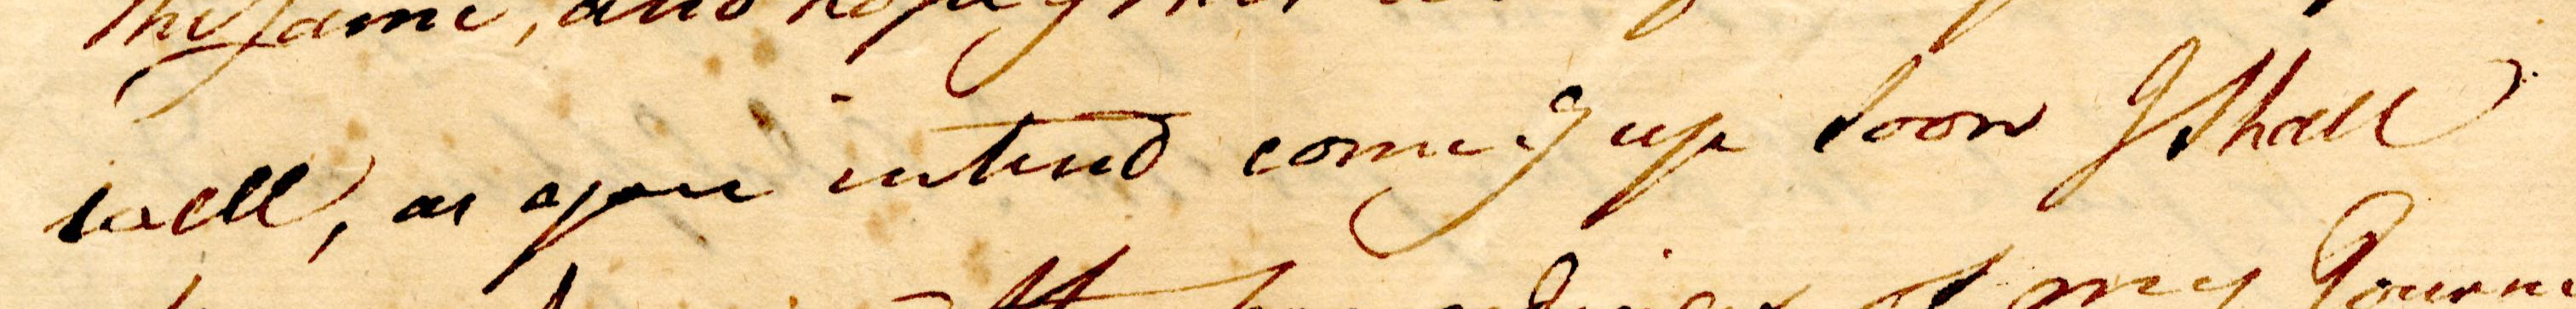well, as again intend come^g up soon I shall
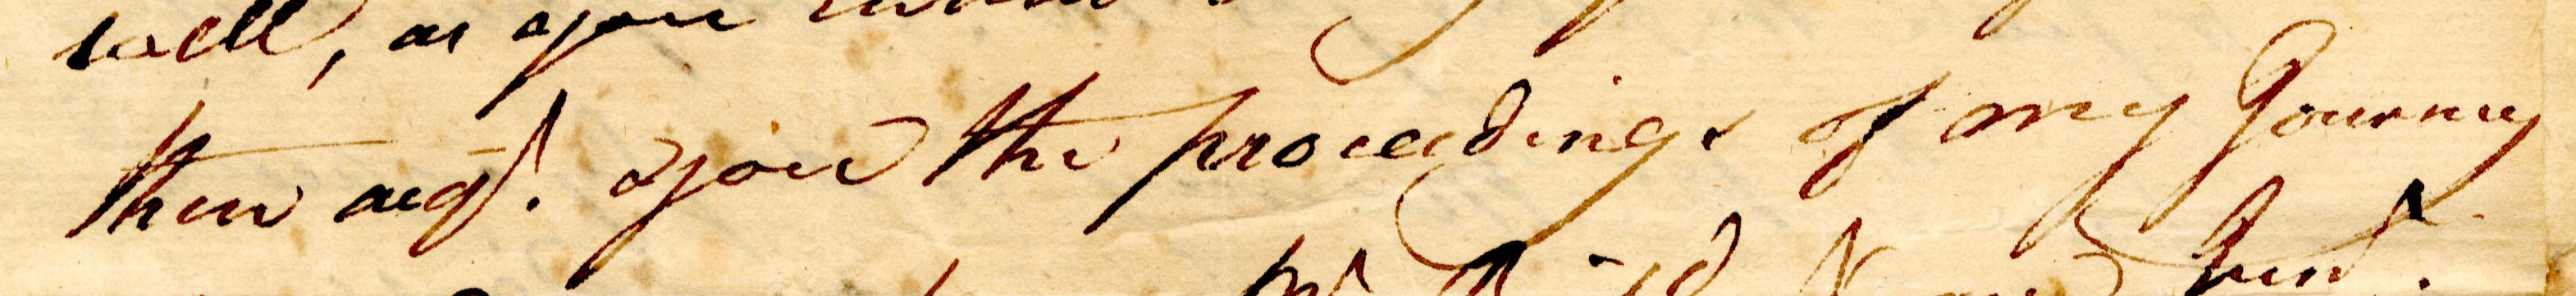then acq^t. you the proceedings of my Journey
